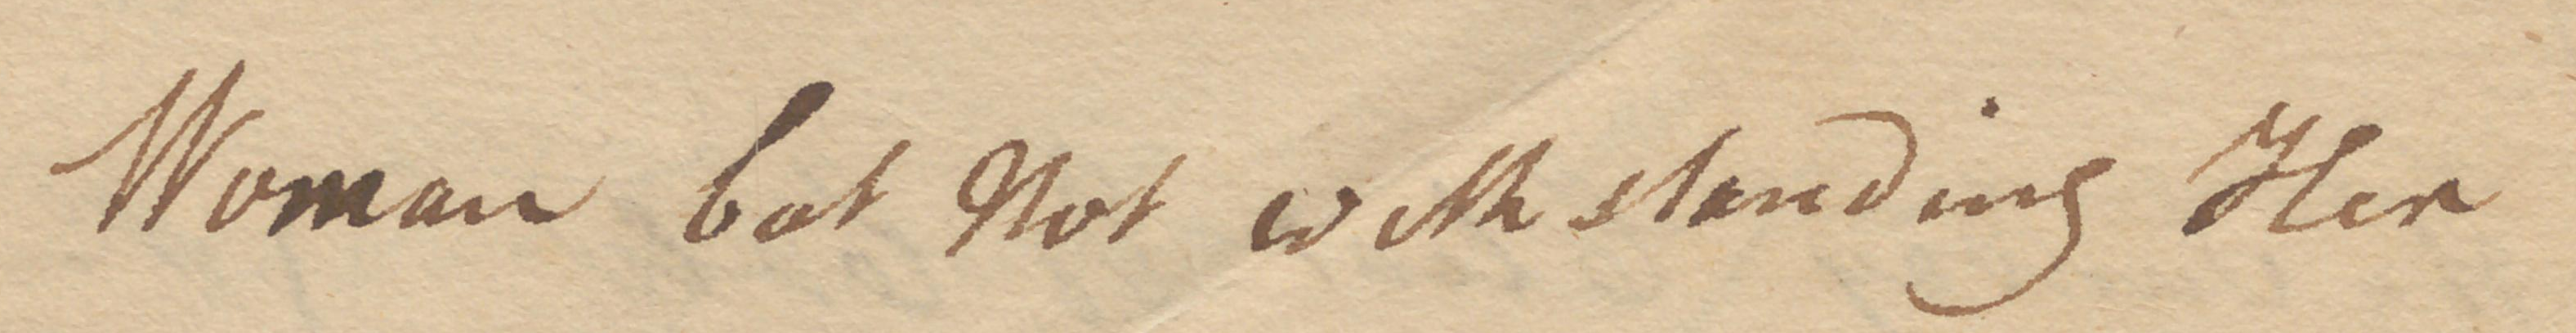Woman bot Not with standing Her
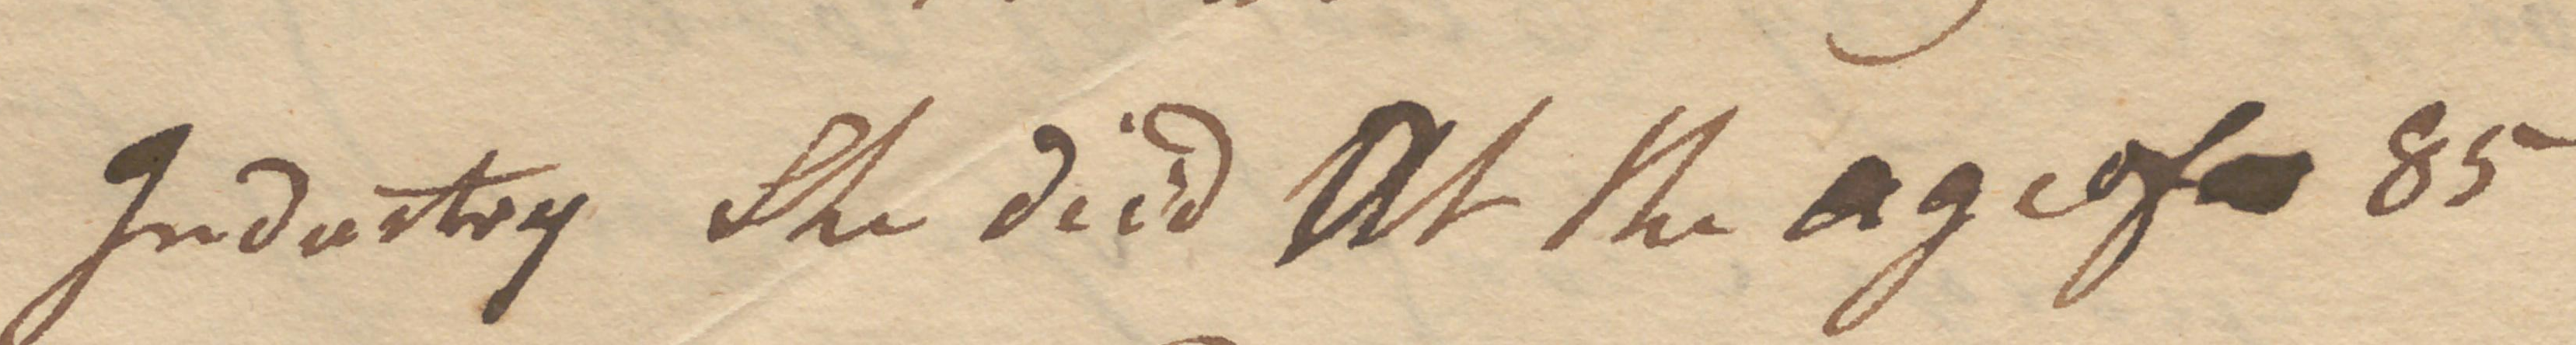Industry she died At the age of 85
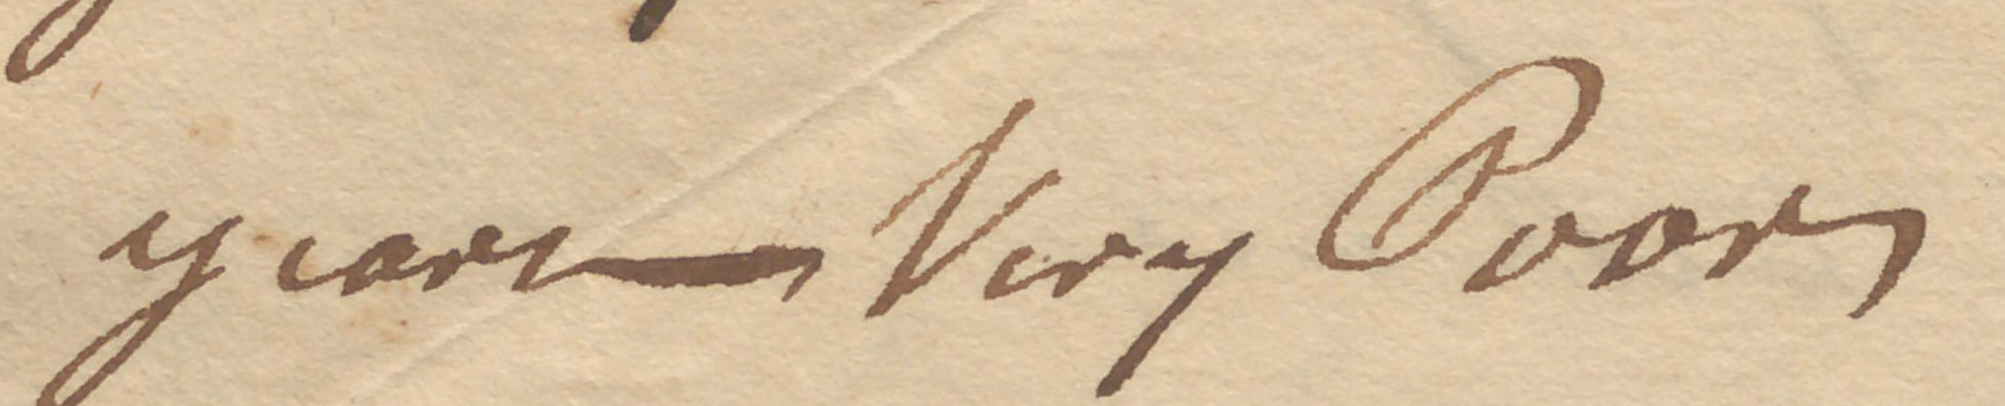years Very Poor
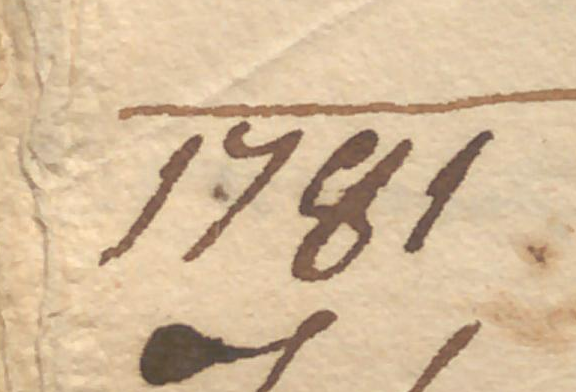1781
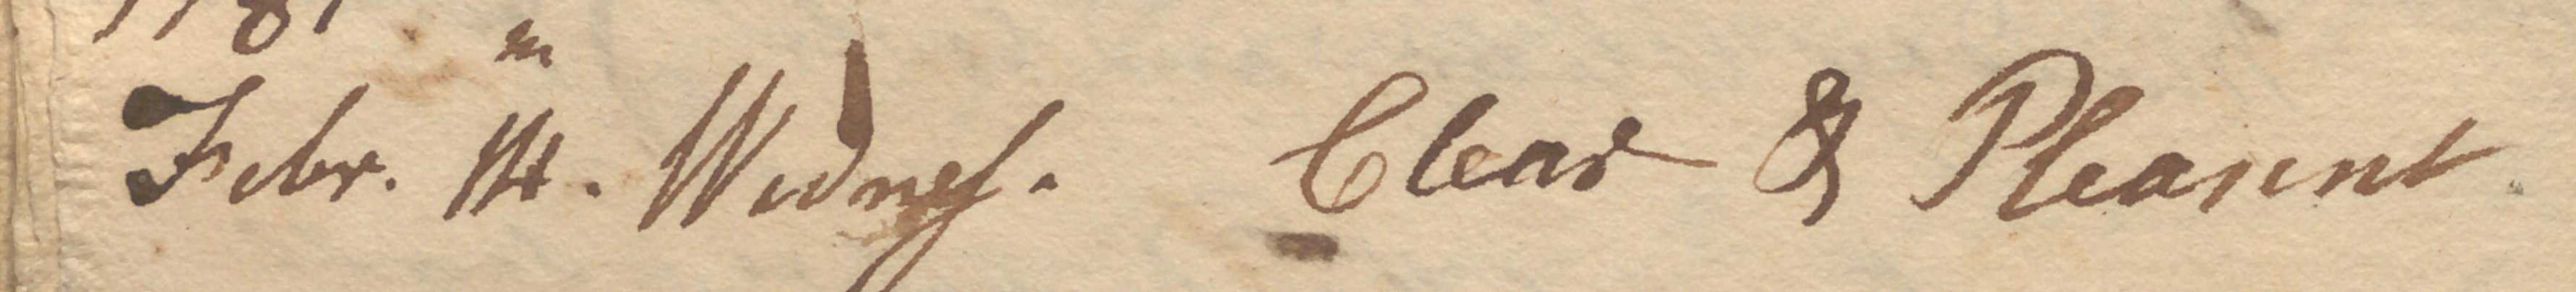Febr. 14^th. Wednes. Clear & Pleasent
